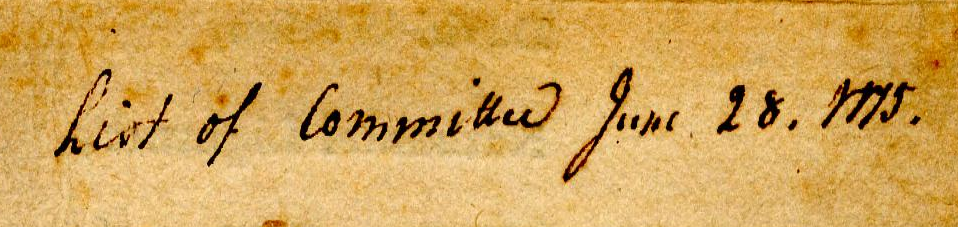List of Committee June 28. 1775.
